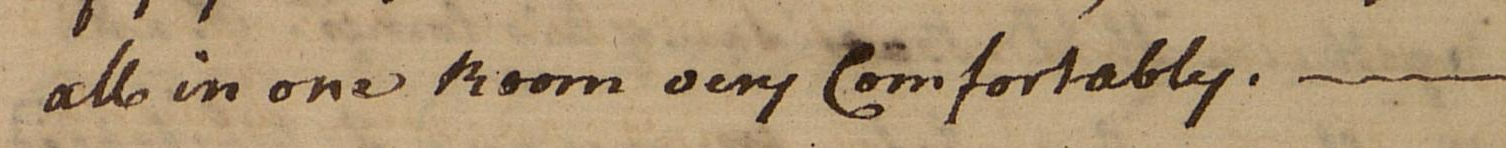all in one Room very Comfortably.-
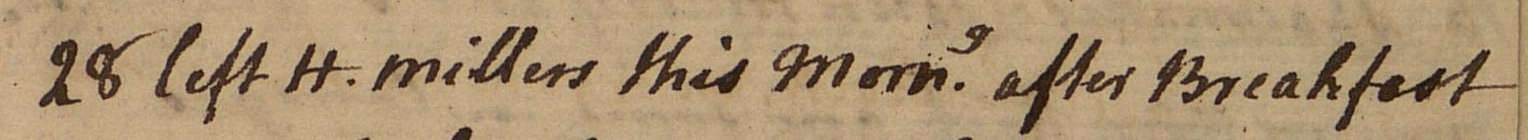28 left H. Millers this morn^g. after Breakfast
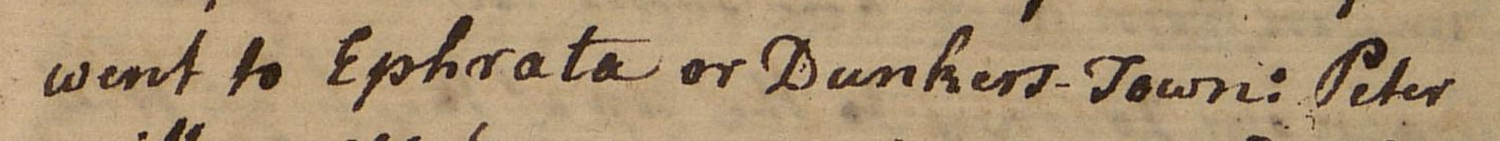went to Ephrata or Dunkers-Town: Peter
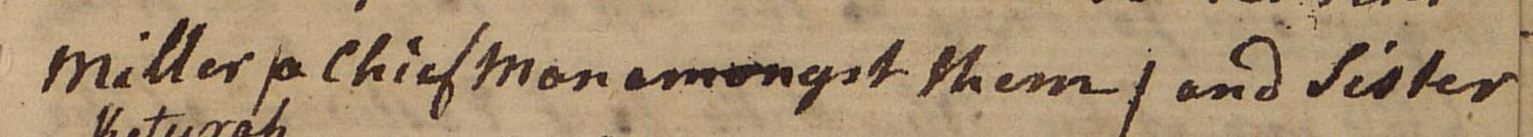Miller /a Chief Man amongst them/ and Sister
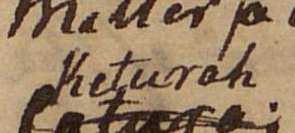Keturah
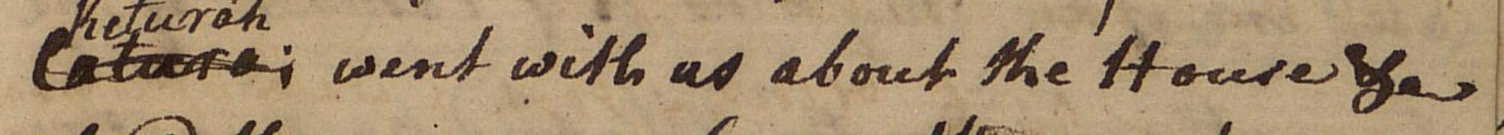[Catura]; went with us about the House &a
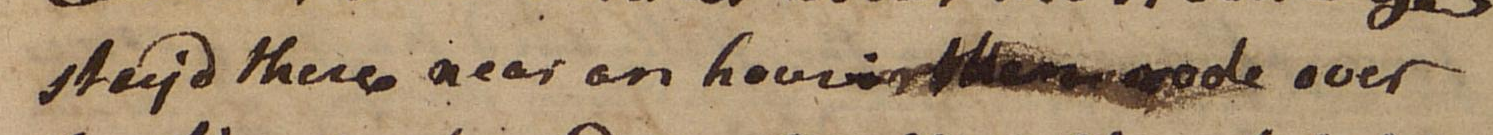stay'd there near an hour then rode over over
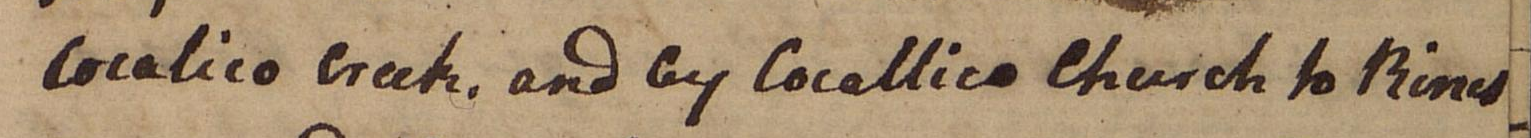Cocalico Creek and by Cocallico Church to Rines
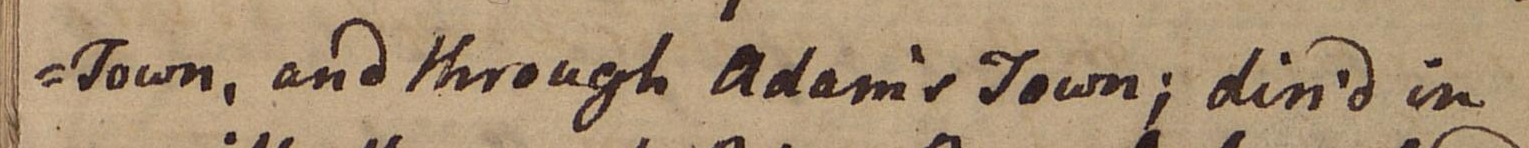-Town, and through Adam's Town, din'd in
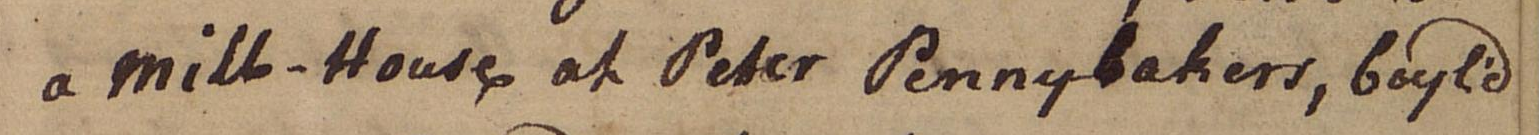a Mill- House at Peter Pennybakers, boyl'd
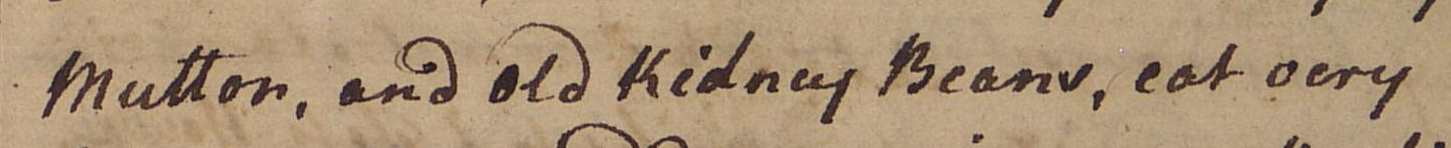Mutton, and old Kidney Beans, eat very
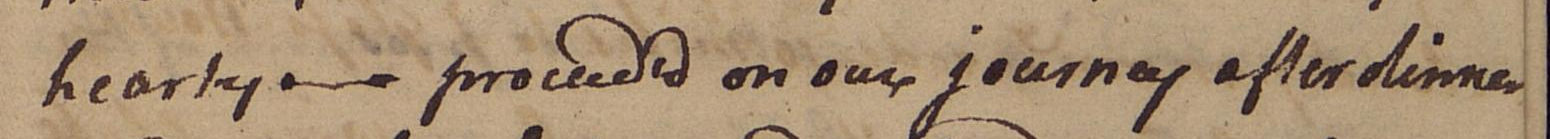hearty- proceeded on our journey after dinner
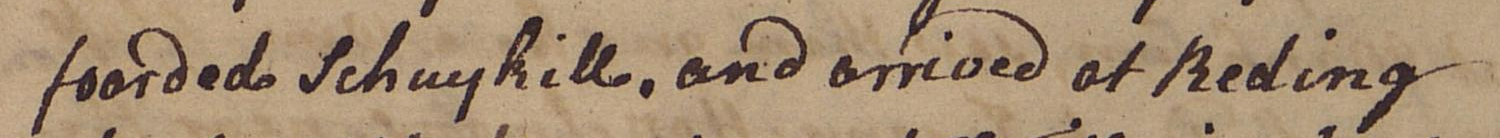foarded Schuykill, and arrived at Reding
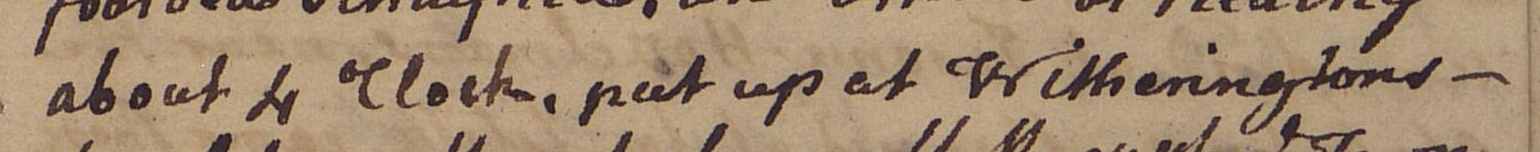about 4 oClock, put up at Witheringtons-
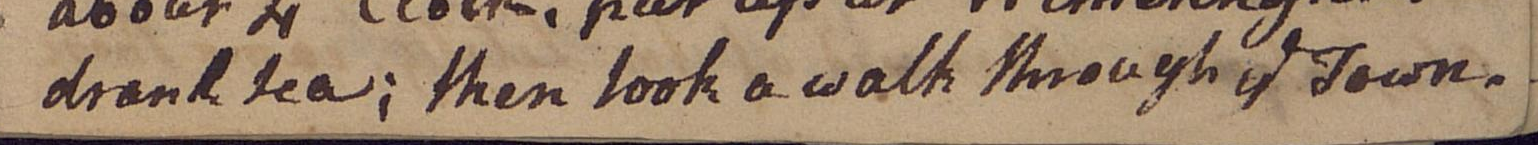drank tea; then took a walk through y^e Town.
